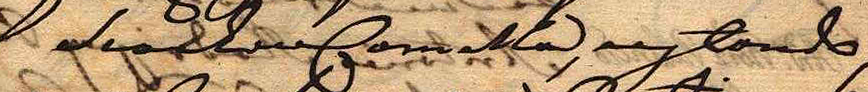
se achou Com ella, e estando
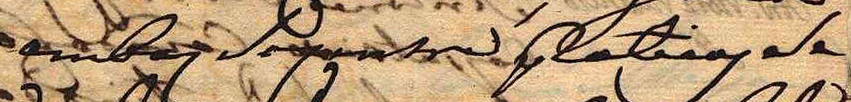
ambas sos entre pRaticas se
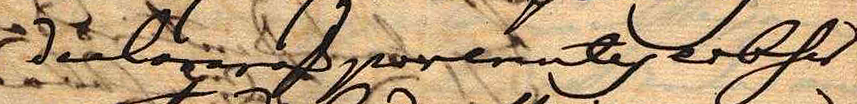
declararaõ por crentes e obser
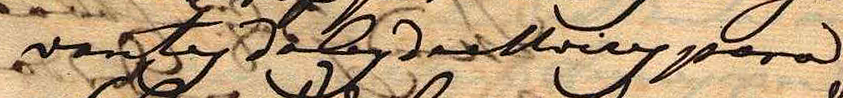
vantes da ley de Moizes para
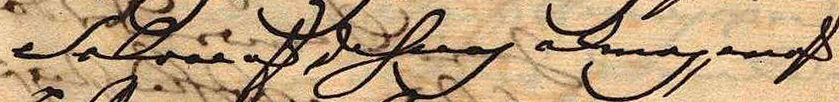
salvaçaõ de suas almas, e naõ
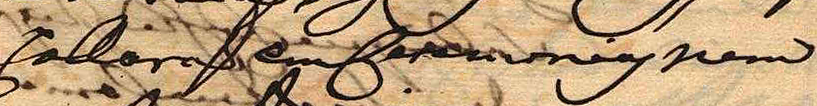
fallaraõ em Ceremonias nem
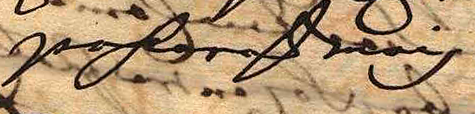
passaraõ mais
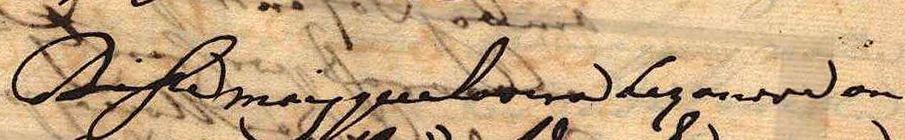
Disse mais que havera dezanove an
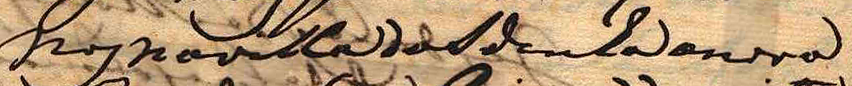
nos na villa da Idanha a nova
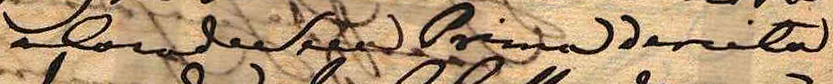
e Caza de Sua Prima direita
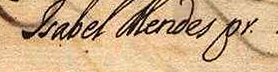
Isabel Mendes pr.
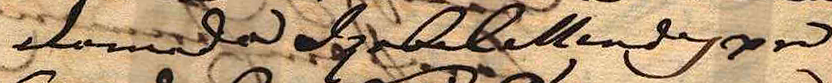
chamada Izabel Mendes x n
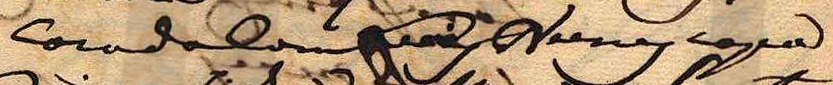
cazada Com Luis Nunes capa
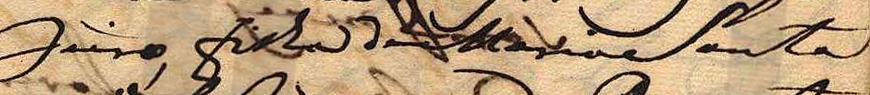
teiro, filha de Maria Santa
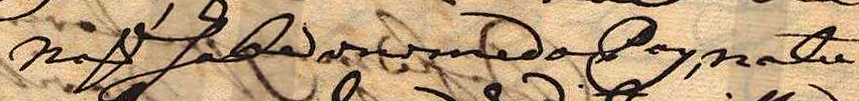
naõ sabe o nome do Pay, natu
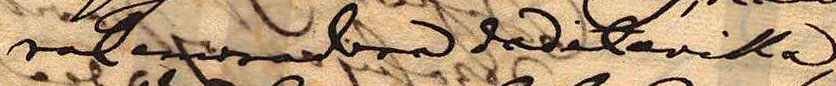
ral e moradora da dita villa,
